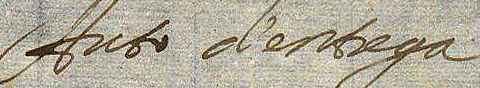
Auto d'entrega
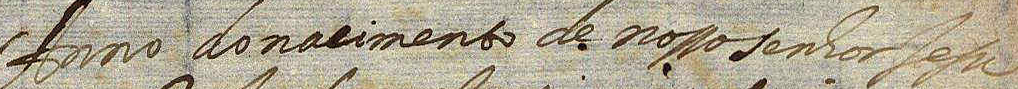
Anno do nacimento de nosso senhor Jesu
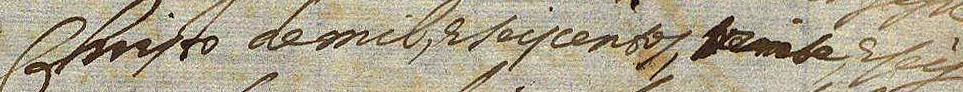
Christo de mil, E seiscentos, vinte, E seis
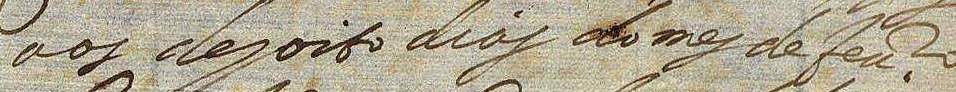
aos dezoito dias do mes de feu.ro
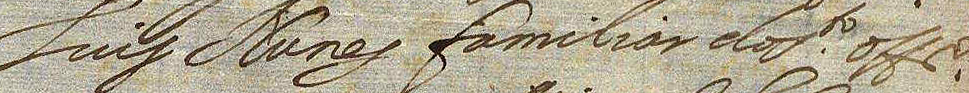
Luis Nunes familiar do sto. offo.
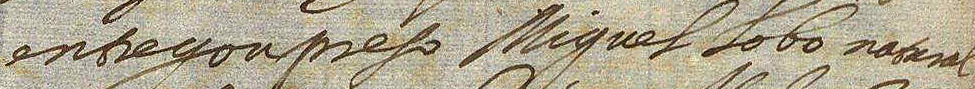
entregou preso Miguel Lobo natural,
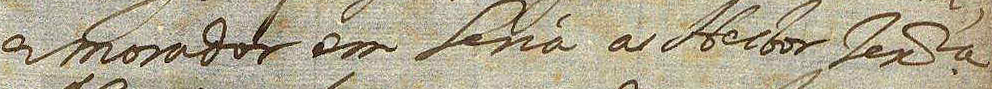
E morador em Leria a Hector Tex.ra
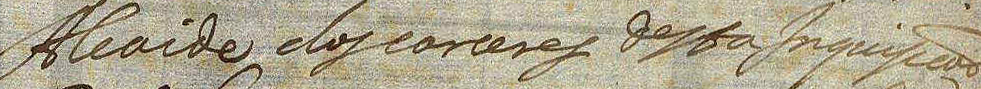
Alcaide dos carceres desta Jnquisição
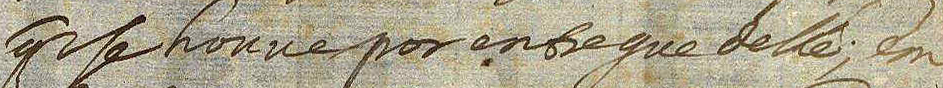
q̄ se houue por entregue delle; em
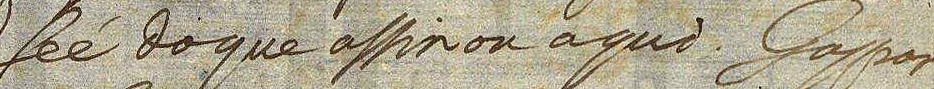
feé do que assinou aqui. Gaspar
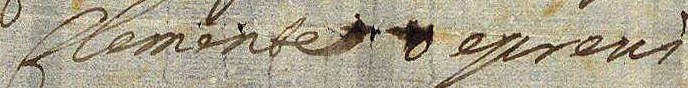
Clemente o escreui
